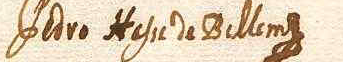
Pedro Hasse de Bellem
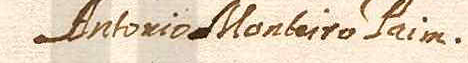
Antonio Monteiro Paim.
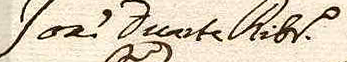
Joaõ Duarte Ribr.o
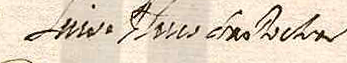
Luis Alues da Rocha
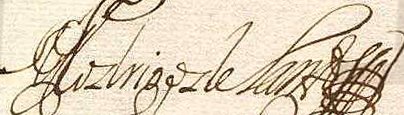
Rodrigo de Lanto
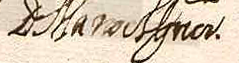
D Manoel Guer.ro
